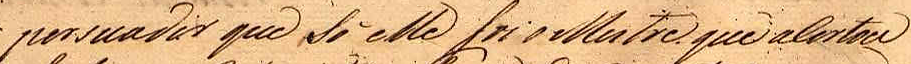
persuadir que só elle foi o Mestre que aCertou
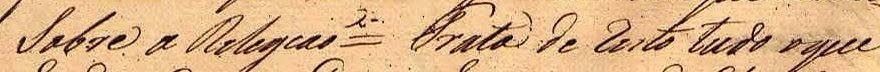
Sobre a Religiaõ = Trata de Resto tudo o que
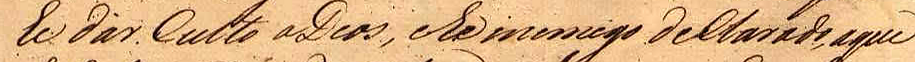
he dar Culto a Deos, e he inimigo deClarado, a que
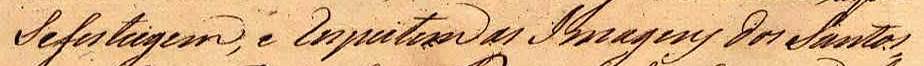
Se festeigem, e Respeitem as Imagens dos Santos
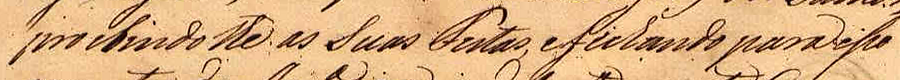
proebindolhe as suas Festas, e fechando para isso
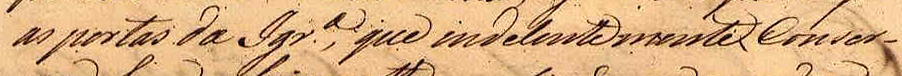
as portas da Igr.a, que indelentemente Conser
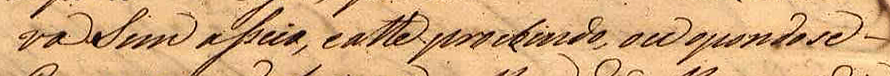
va Sem asseio, e athe proebindo, ou opondose
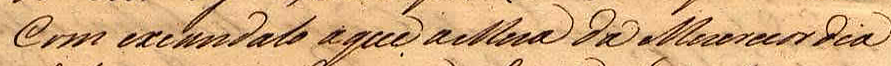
Com excandalo a que a Meza da Mesericordia
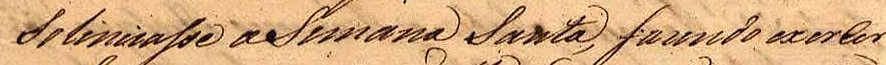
Solinizasse a Semana Santa, fazendo exercer
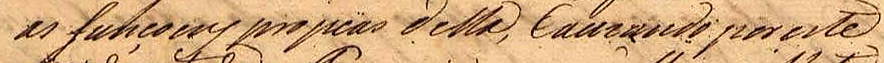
as funçoens propias della, Cauzando por este
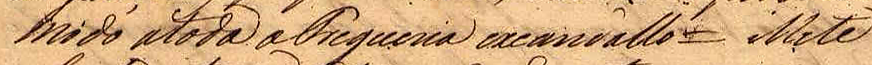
modo a toda a Freguezia excandallo= Mete
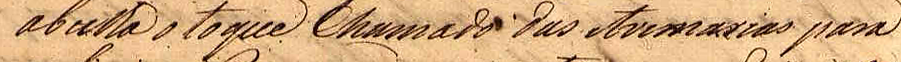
a bulla o toque Chamado das Ave marias para
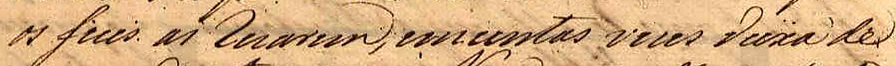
os fieis as Rezarem, e muntas vezes deixa de
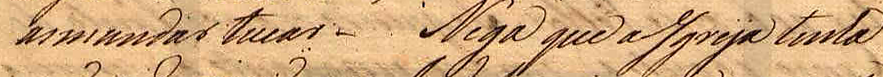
as mandar tucar - Nega que a Jgreja tenha
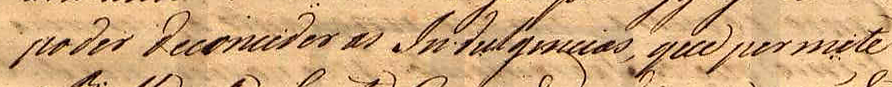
poder de conceder as Indulgencias, que permite
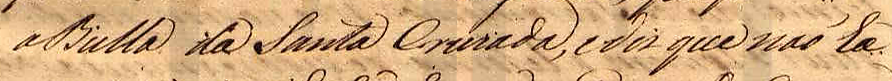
a Bulla da Santa Cruzada, e dis que naõ ha
